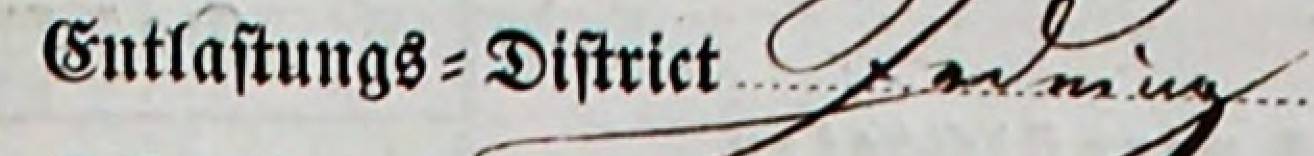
Entlastungs=District Jrdning
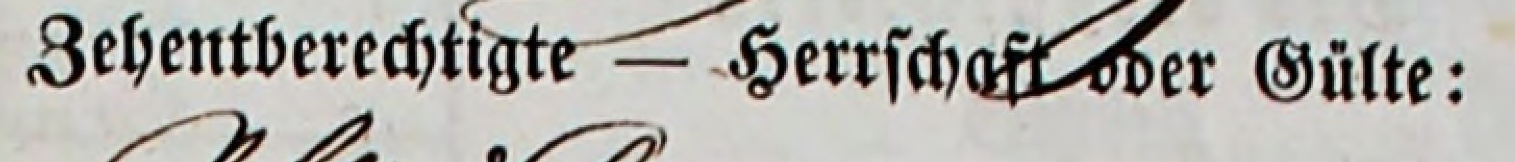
Zehentberechtigte — Herrschaft oder Gülte:
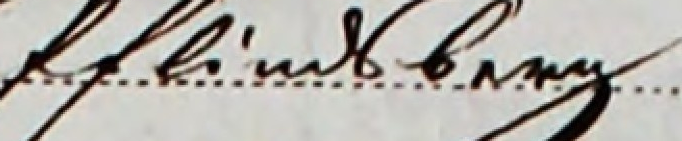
Pflindsberg
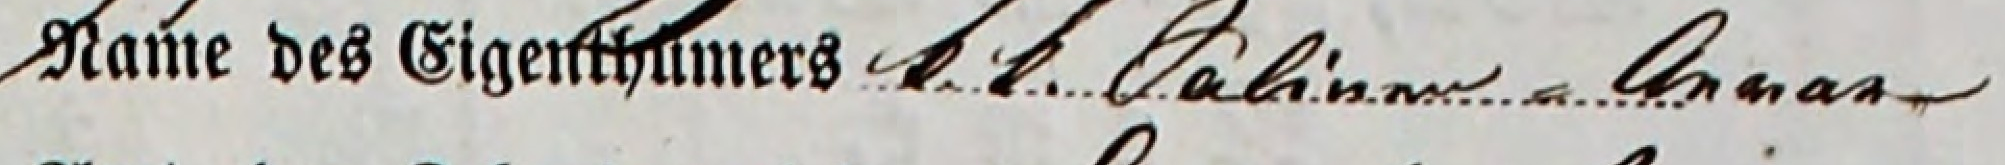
Name des Eigenthümers k.k. Sabinen = Annan
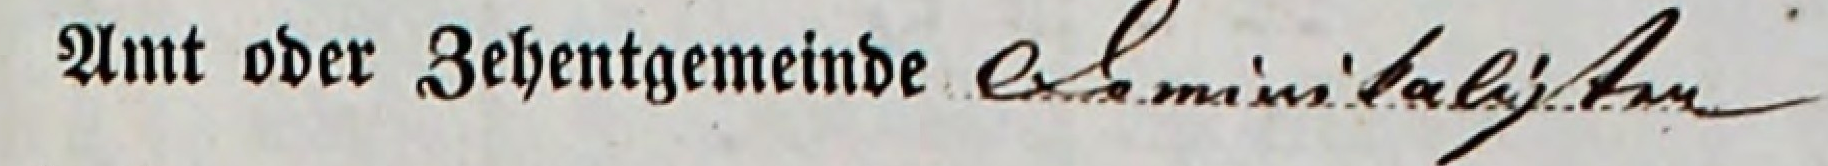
Amt oder Zehentgemeinde Dominikalisten
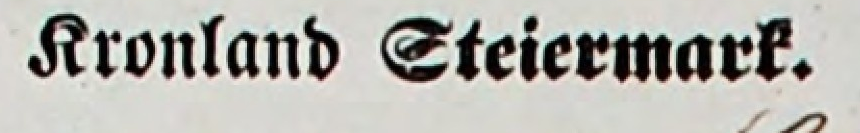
Kronland Steiermark.
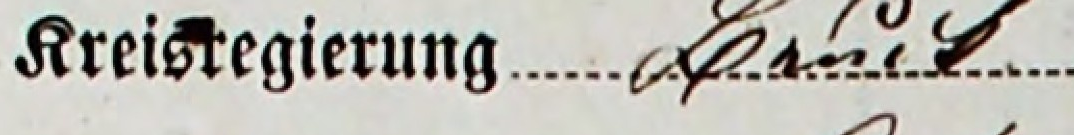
Kreisregierung Bruck
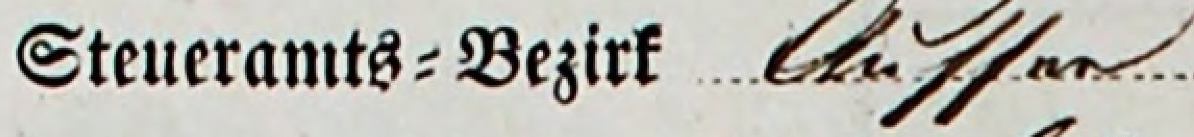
Steueramts=Bezirk Aussee
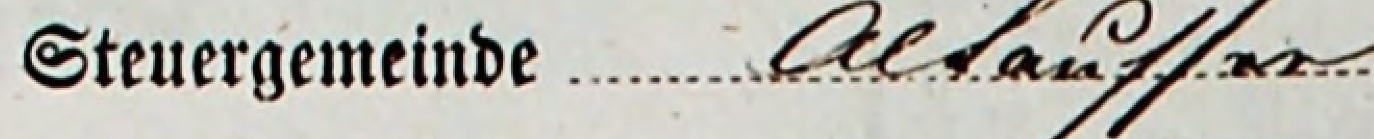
Steuergemeinde Altaussee
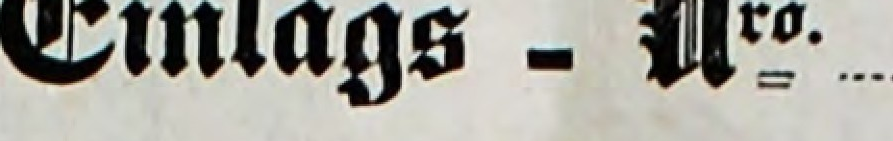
Einlag - Nro.
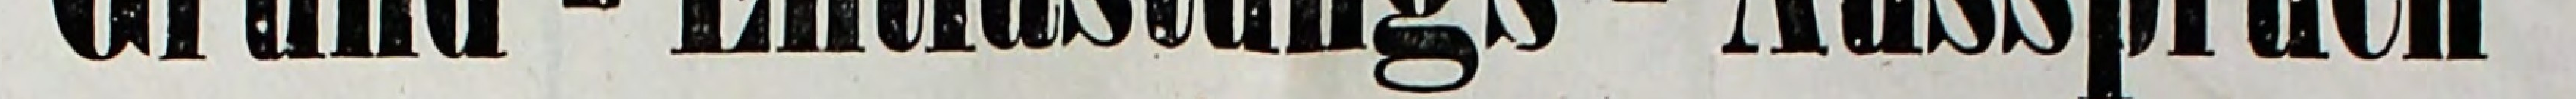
Grund - Entlastungs - Ausspruch
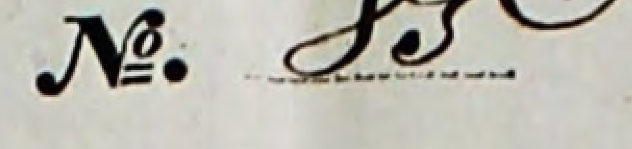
No. 85
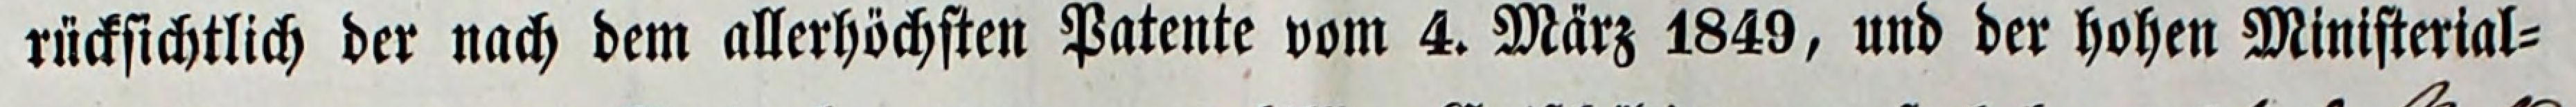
rücksichtlich der nach dem allerhöchsten Patente vom 4. März 1849, und der hohen Ministerial=
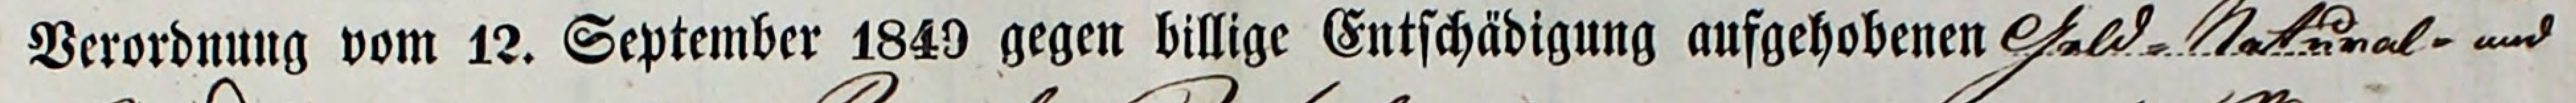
Verordnung vom 12. September 1849 gegen billige Entschädigung aufgehobenen Geld = Natural = und
